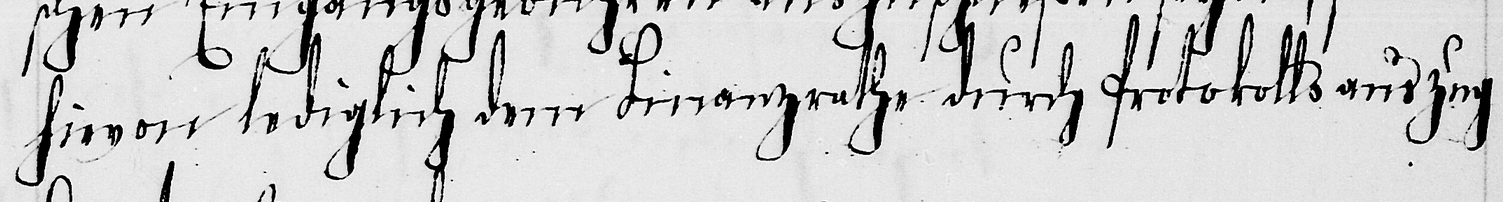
hievon lediglich dem Finanzrathe durch Protokollsauszug
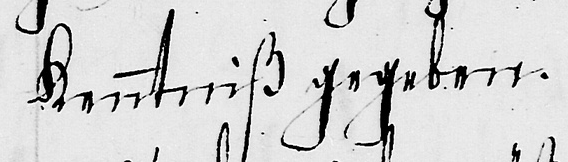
Kenntniß gegeben.
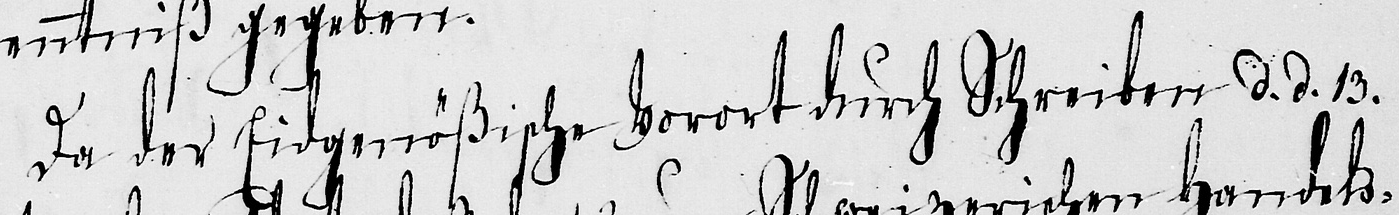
Da der Eidgenößische Vorort durch Schreiben d.d. 13.
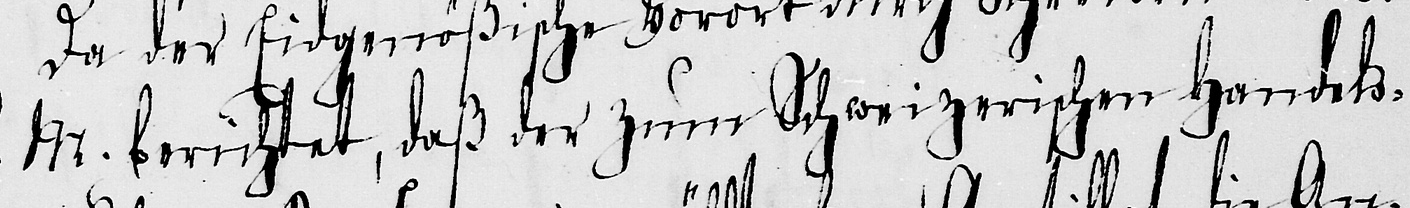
M. berichtet, daß der zum Schweizerischen Handel¬
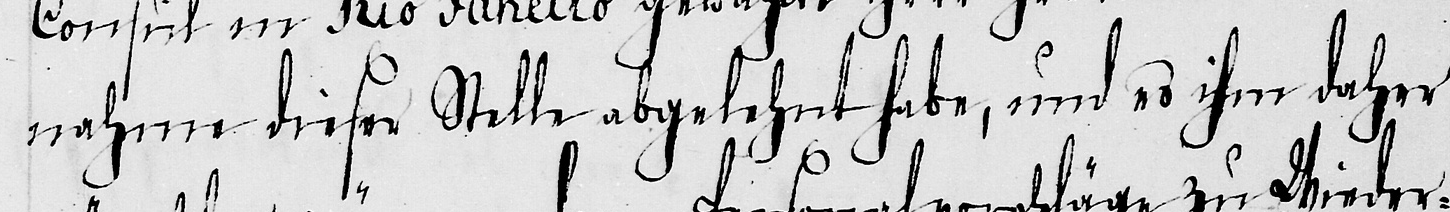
nahme dieser Stelle abgelehnt habe, und es ihm daher
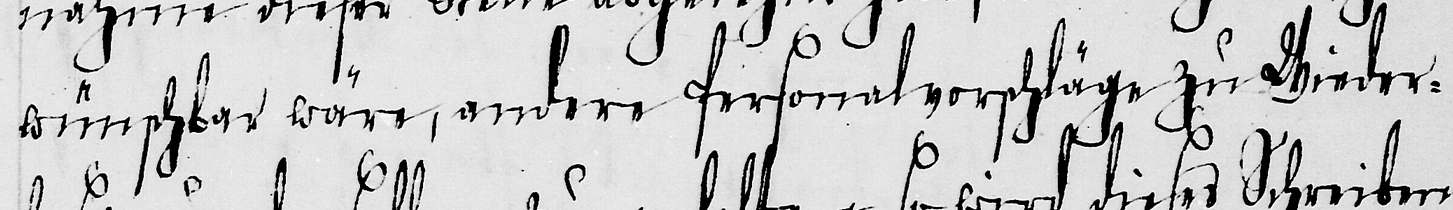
wünschbar wäre, andere Personalvorschläge zu Wieder¬
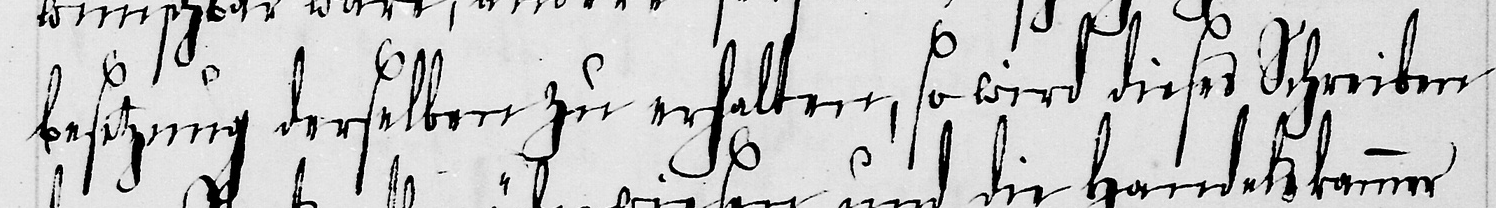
besetzung derselben zu erhalten, so wird dieses Schreiben
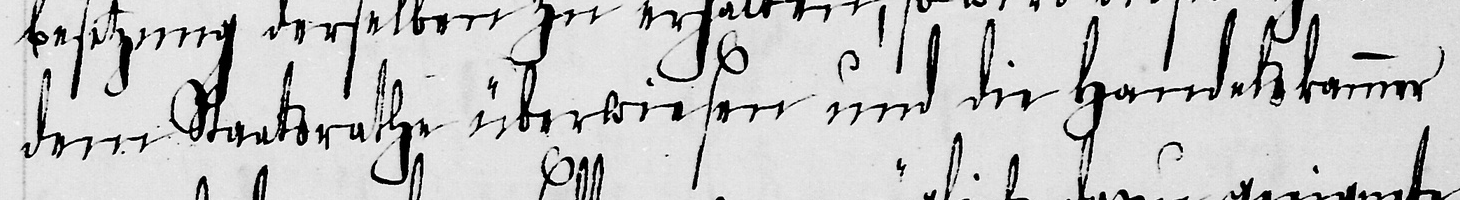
dem Staatsrathe überwiesen und die Handelskammer
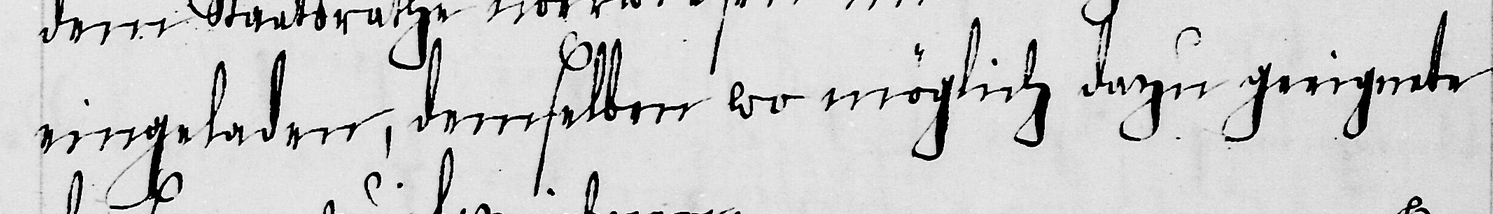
eingeladen, demselben wo möglich dazu geeignete
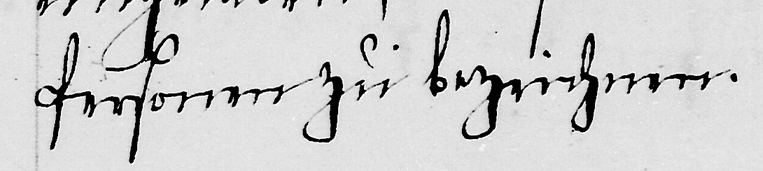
Personen zu bezeichnen.
